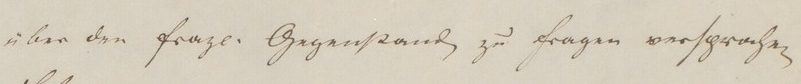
über den fragl. Gegenstand zu fragen versprochen
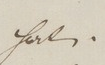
hat.
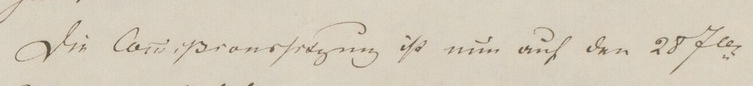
Die Commißionssitzung ist nun auf den 28 7br
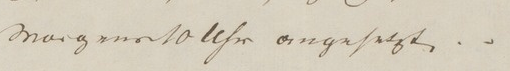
Morgens 10 Uhr angesetzt. –
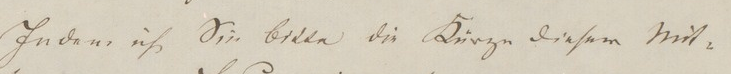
Indem ich Sie bitte die Kürze dieser Mit-
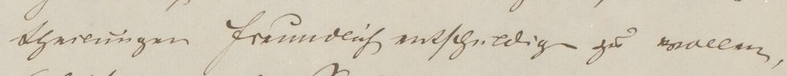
theilungen freundlich entschuldigen zu wollen,
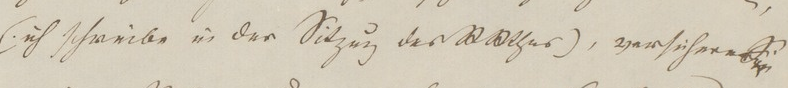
(ich schreibe in der Sitzung des RRthes), versichere Sie
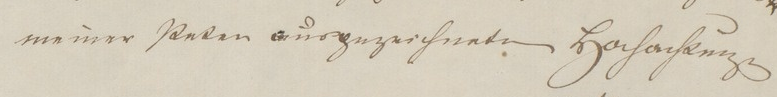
meiner steten ausgezeichneten Hochachtung
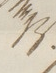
J.
